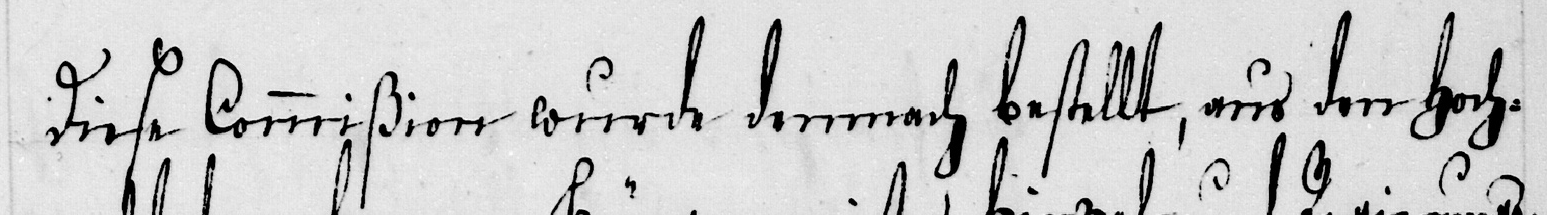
Diese Commißion wurde demnach bestellt, aus den Hoch¬
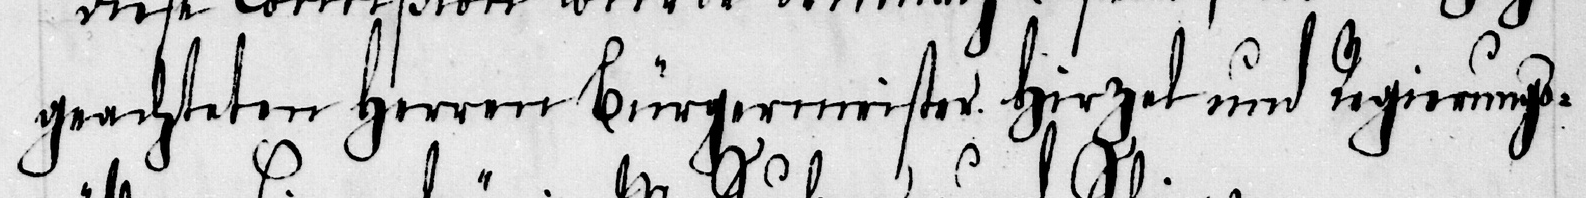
geachteten Herren Bürgermeister Hirzel und Regierungs¬
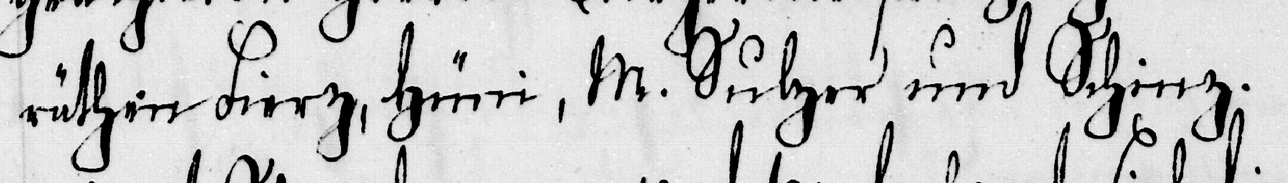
räthen Fierz, Hüni, M. Sulzer und Schinz.
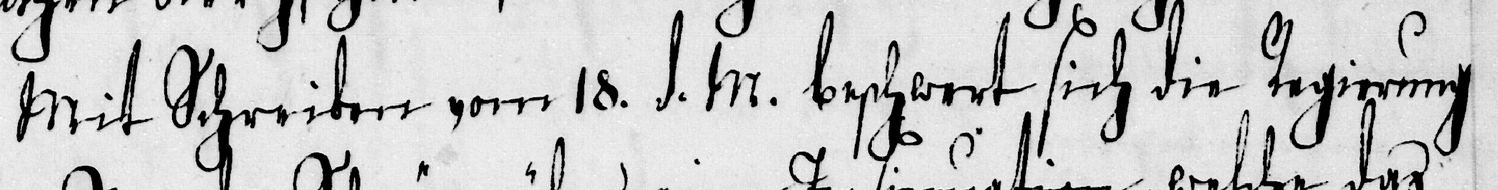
Mit Schreiben vom 18. d. M. beschwert sich die Regierung
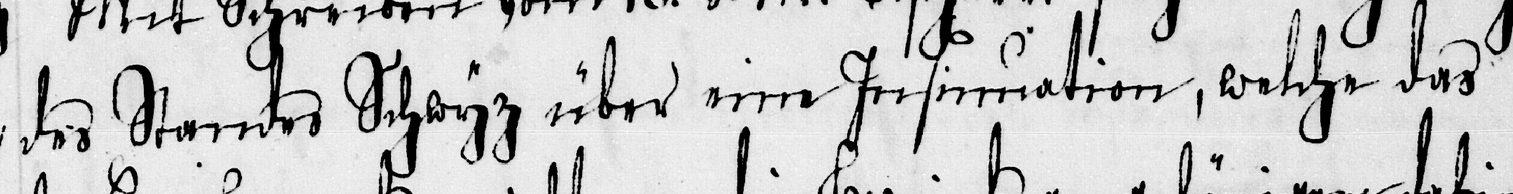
des Standes Schwyz über eine Insinuation, welche das
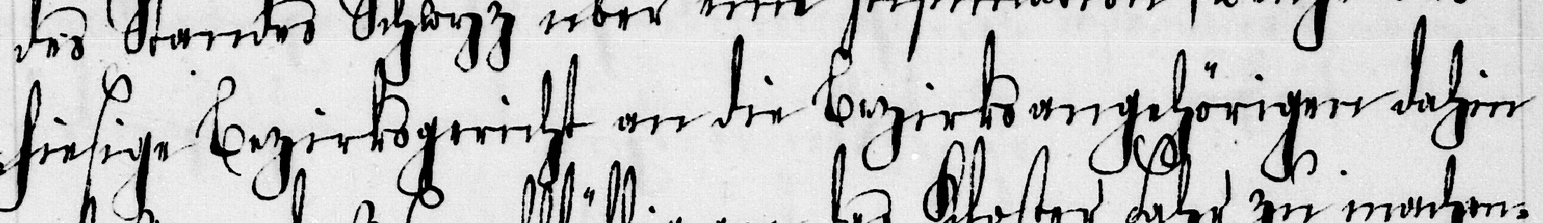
hiesige Bezirksgericht an die Bezirksangehörigen dahin
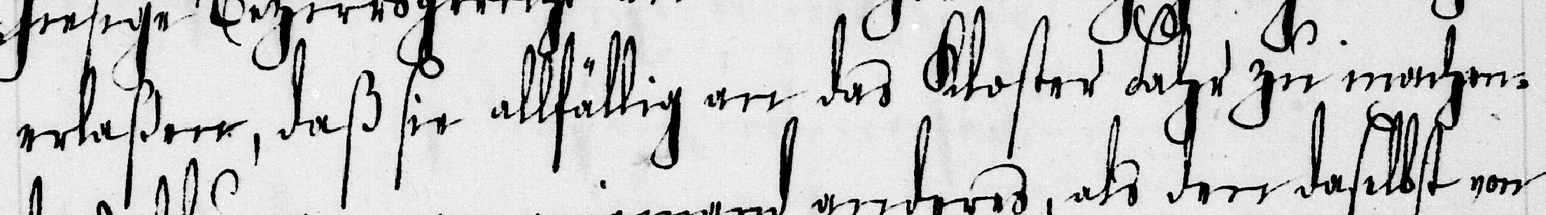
erlaßen, daß sie allfällige an das Kloster Fahr zu machen¬
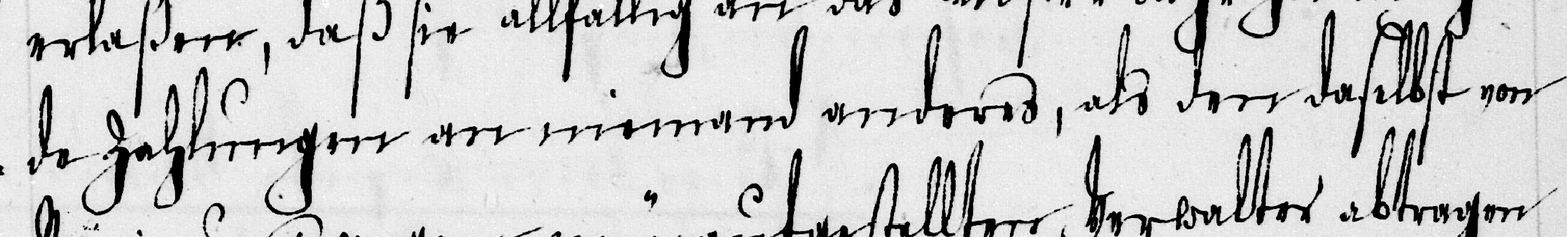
de Zahlungen an niemand anders, als den daselbst von
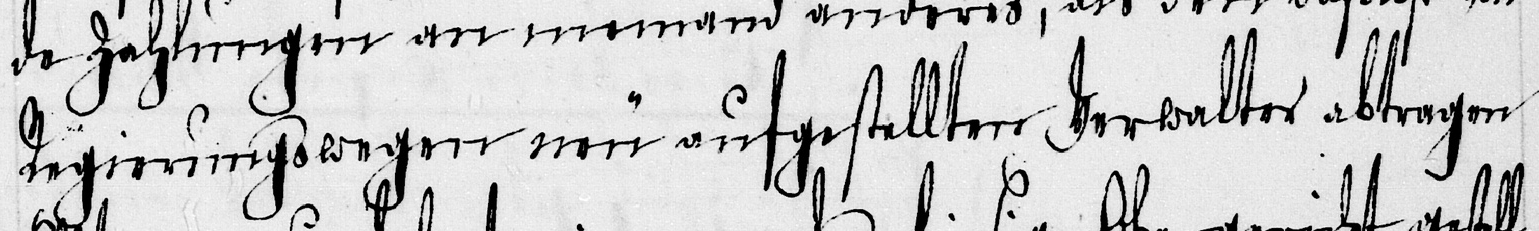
Regierungswegen neu aufgestellten Verwalter abtragen
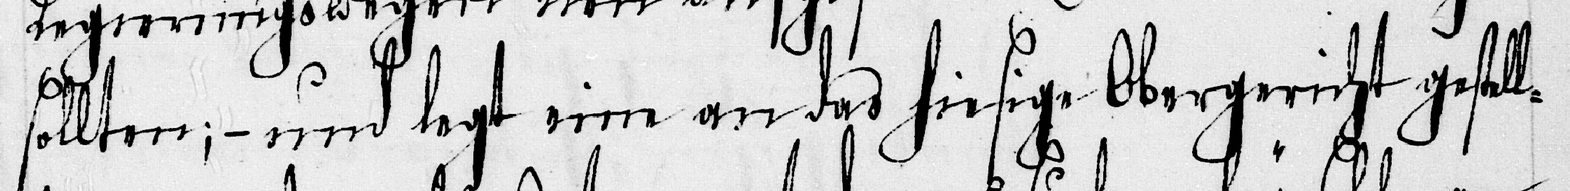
sollten; – und legt eine an das hiesige Obergericht gestel¬
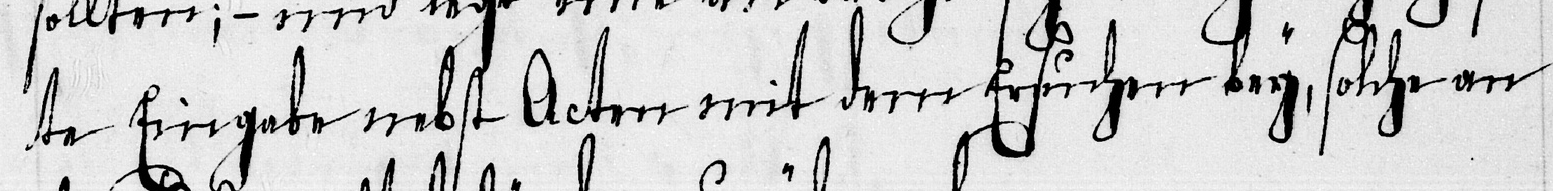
lte Eingabe nebst Acten mit dem Ersuchen bey, solche an
